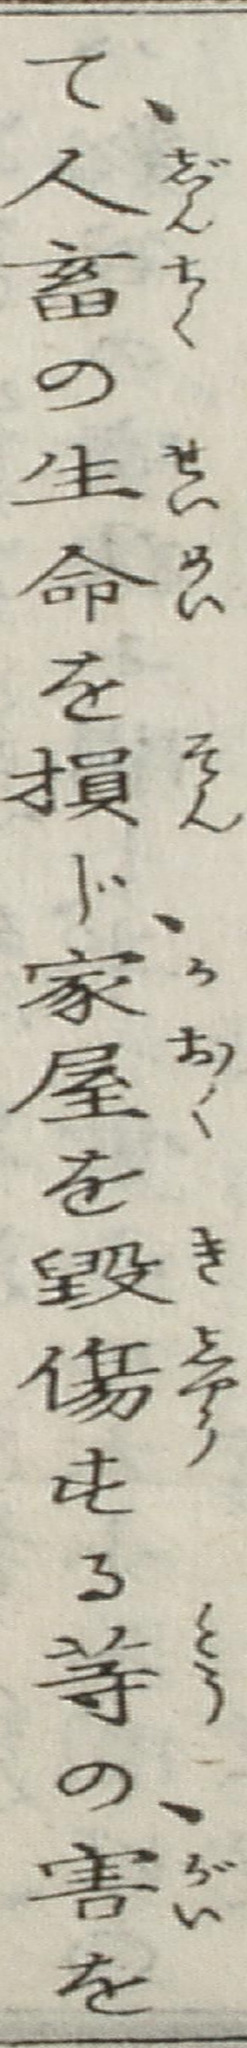て、人畜の生命を損じ、家屋を毀傷する等の、害を
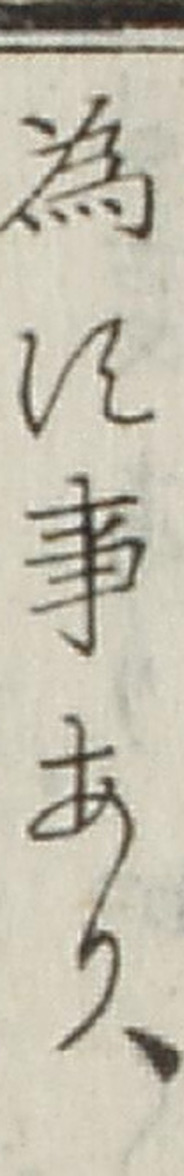為す事あり、
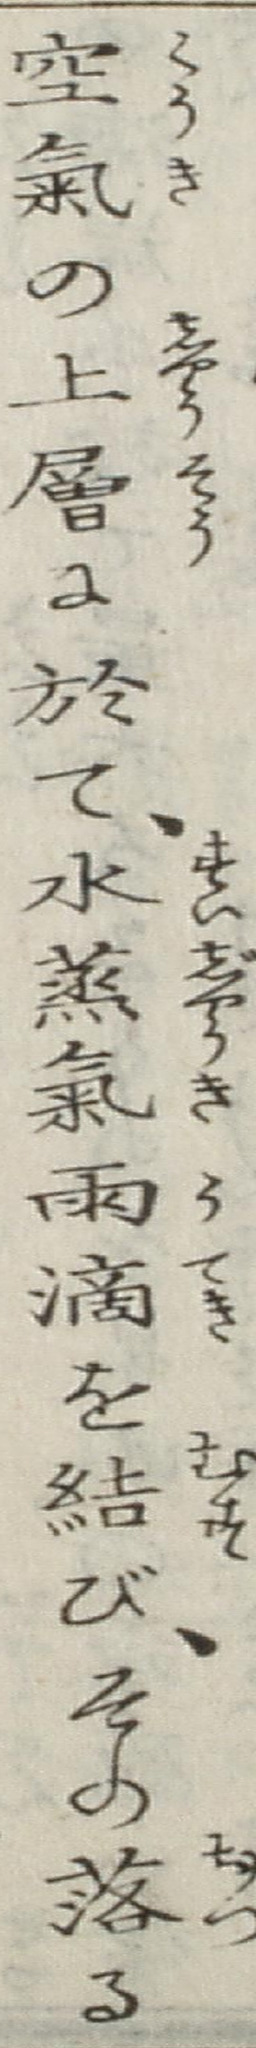空気の上層に於て、水蒸気雨滴を結び、その落る
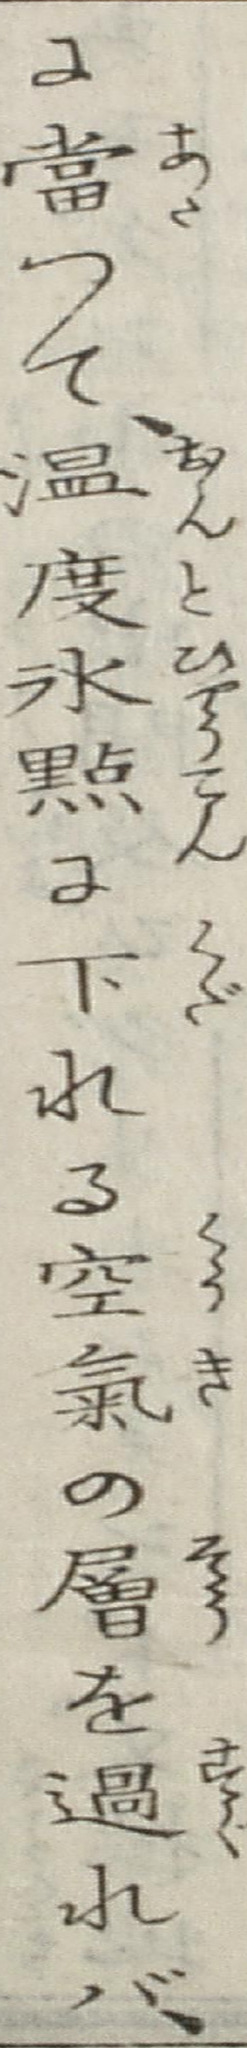に当つて、温度氷点に下れる空気の層を過れば、
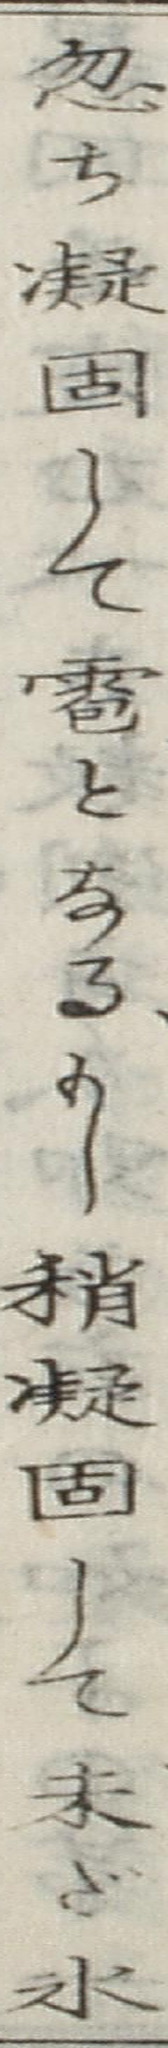忽ち凝固して雹となる、もし稍凝固して未だ氷
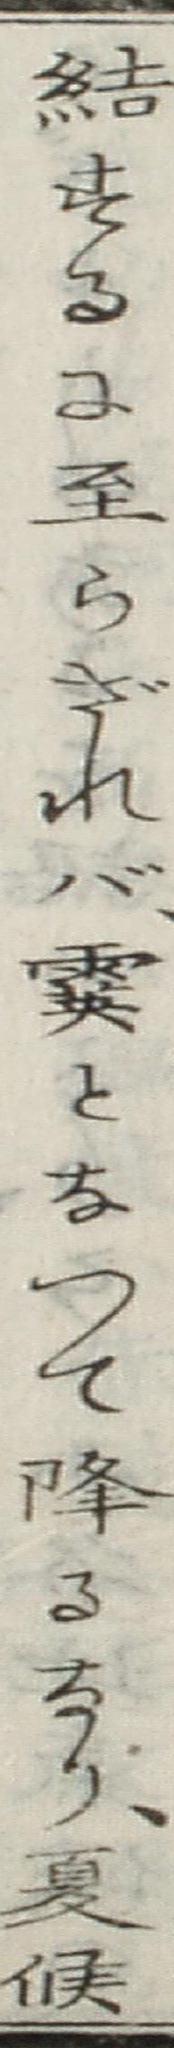結するに至らざれば、霙となつて降るなり、夏候
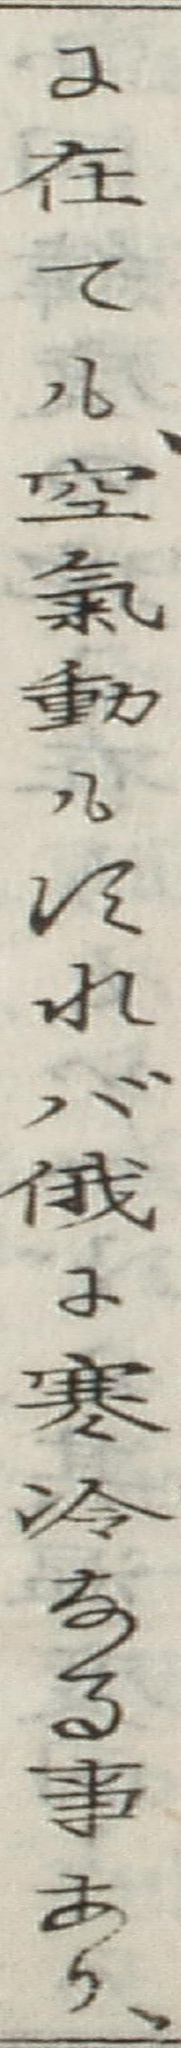に在ても、空気動もすれば俄に寒冷なる事あり、
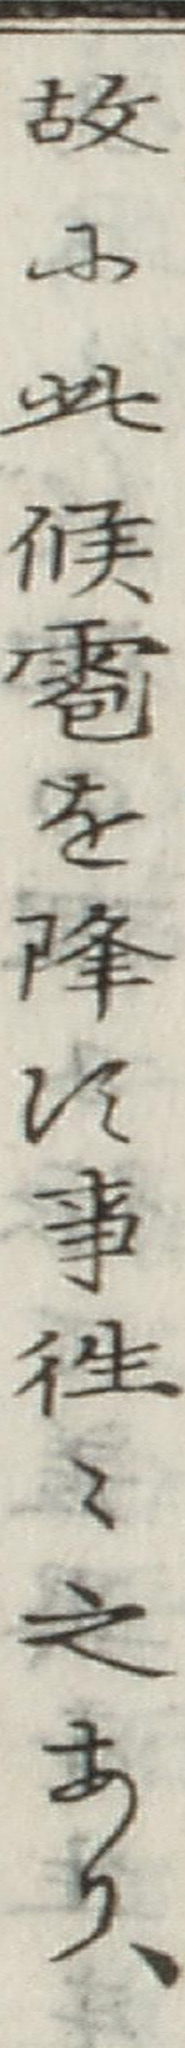故に此候雹を降す事往々之あり、
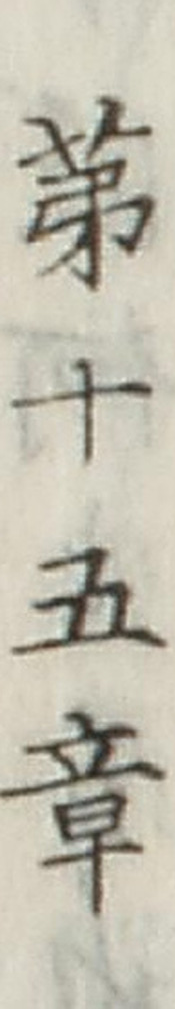第十五章
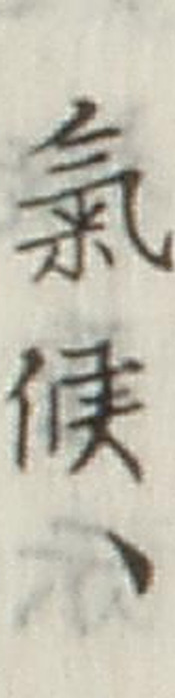気候、
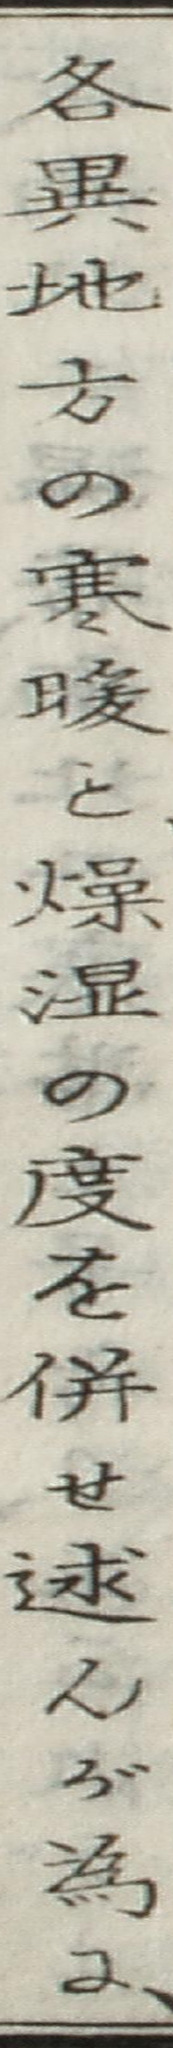各異地方の寒暖と、乾湿の度を併せ述んが為に、
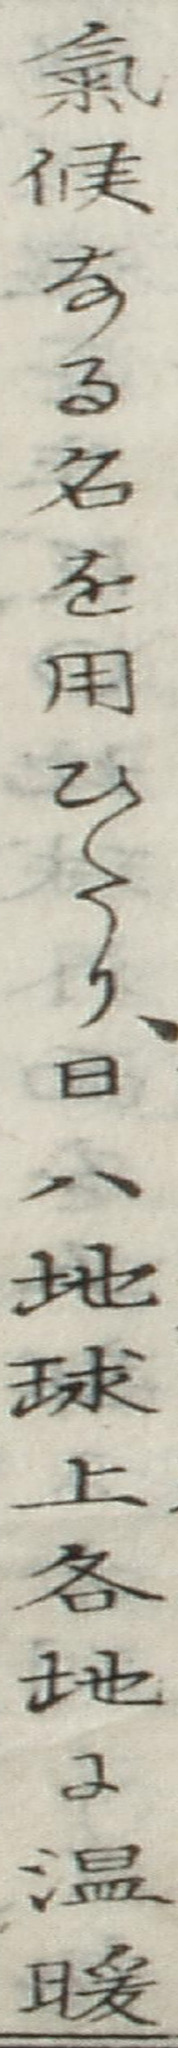気候なる名を用ひたり、日は地球上各地に温暖
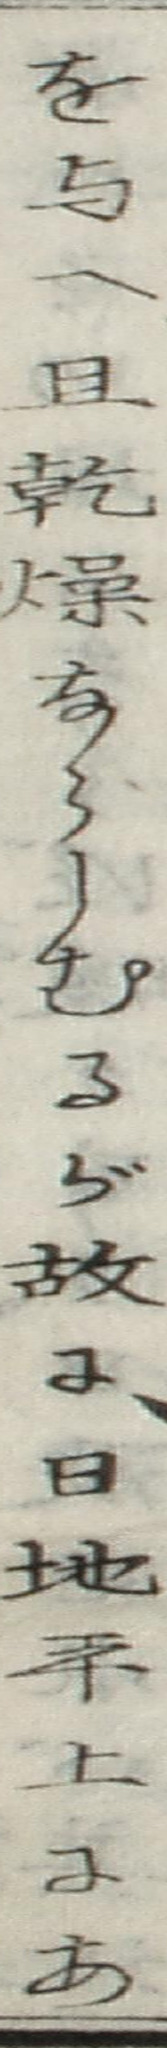を与え、且乾燥ならしむるが故に、日地平上にあ

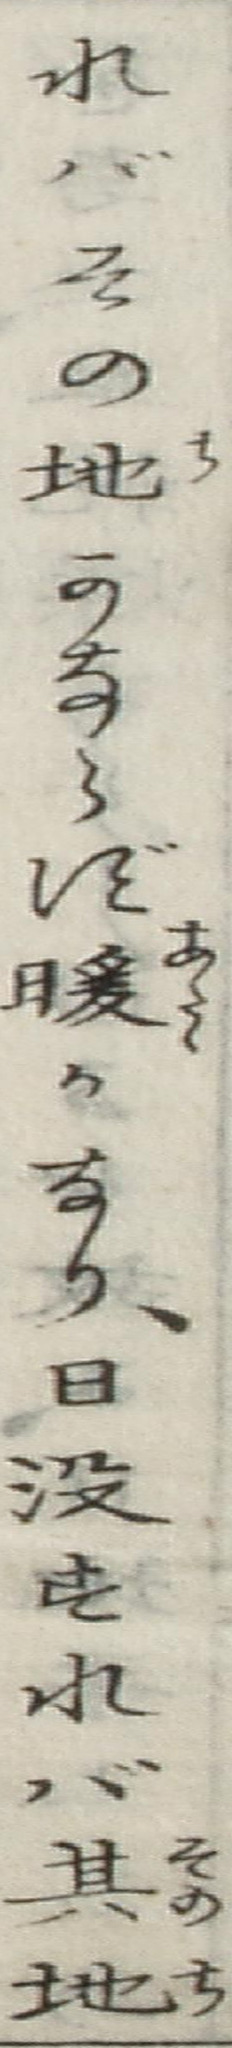ればその地かならず暖かなり、日没すれば其地
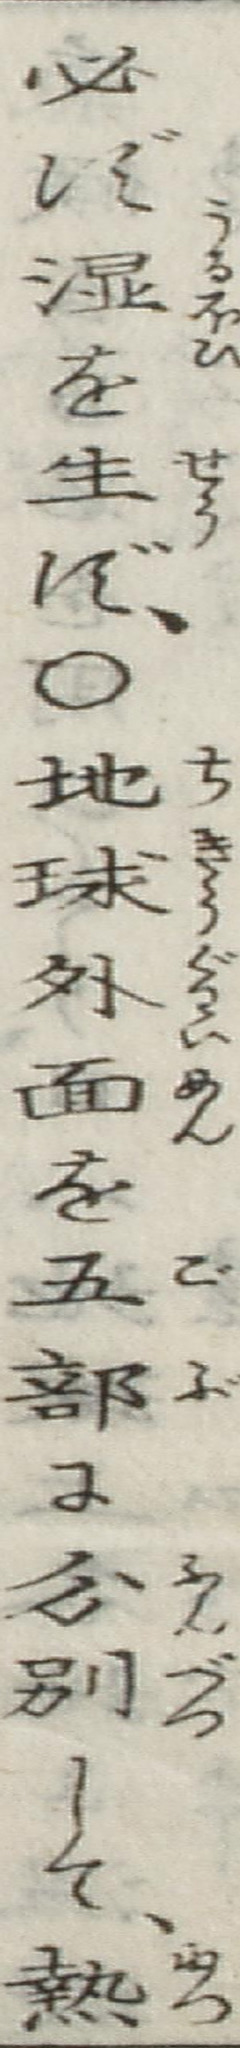必ず湿を生ず、○地球外面を五部に分別して、熱
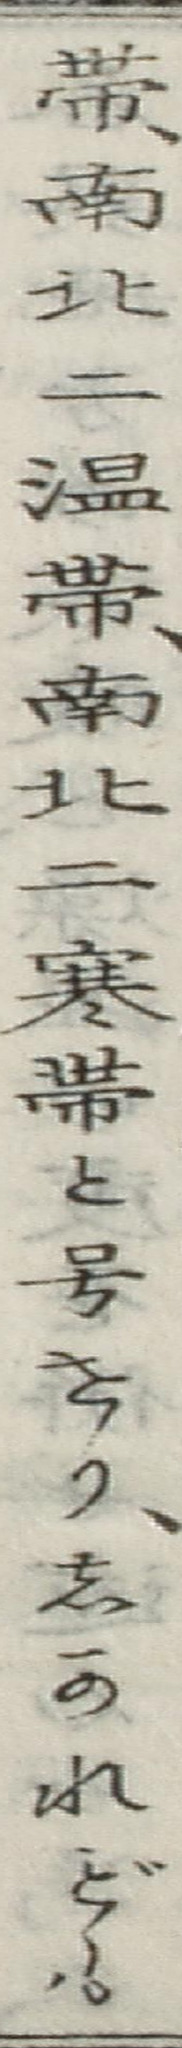帯、南北二温帯、南北二寒帯と号せり、しかれども
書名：訓蒙　天然地理學　下
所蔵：東京大学地震研究所図書室 Earthquake Research Institute Library, The University of Tokyo, JAPAN
